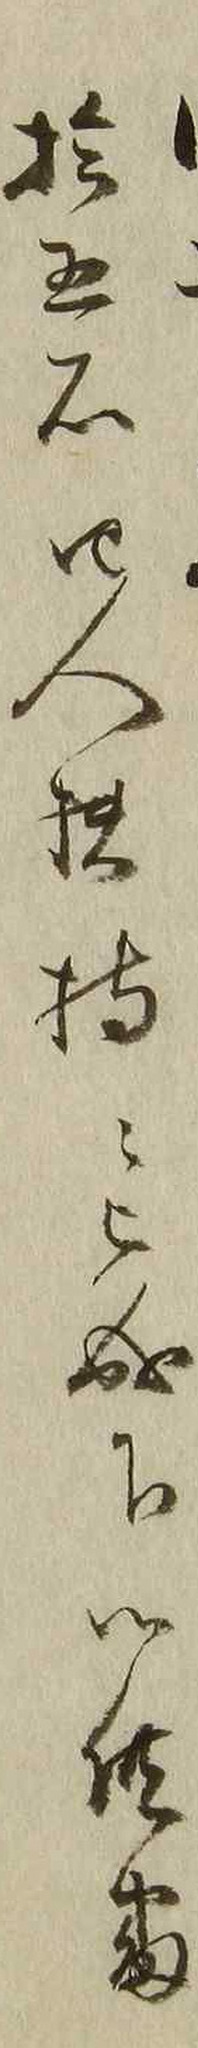拾五石四人扶持ニ被成下御供番
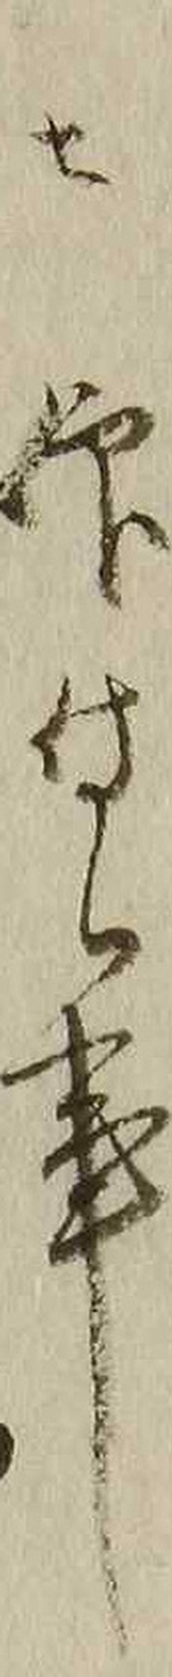被仰付候事
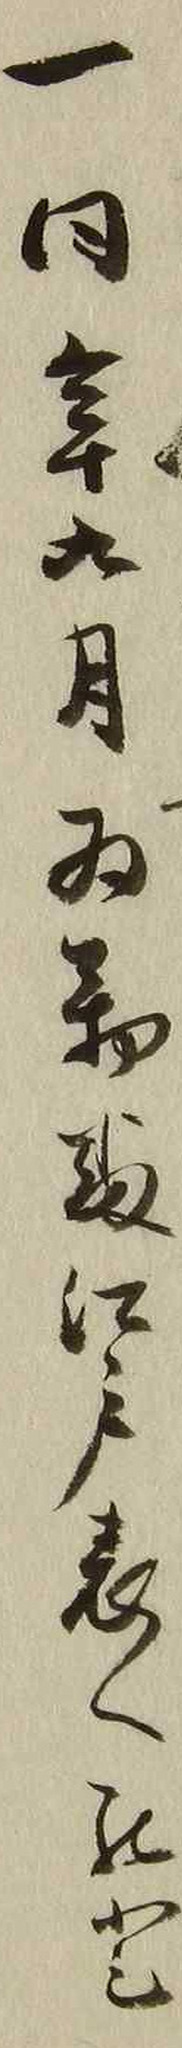一同年九月為勤番江戸表へ罷登
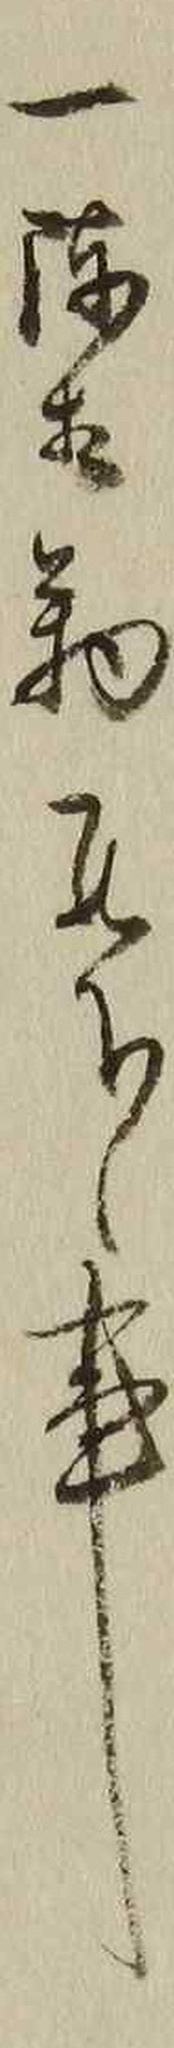一陣相勤罷下候事
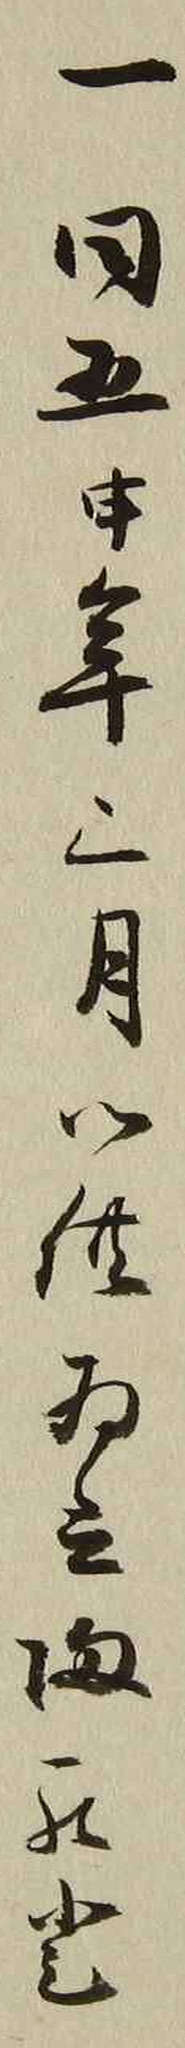一同五申年三月御供為立帰罷登
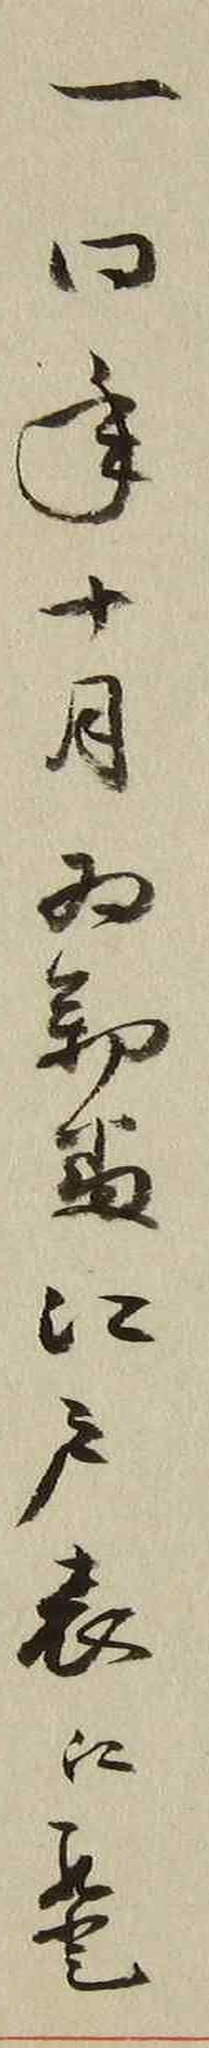一同年十月為勤番江戸表江罷登
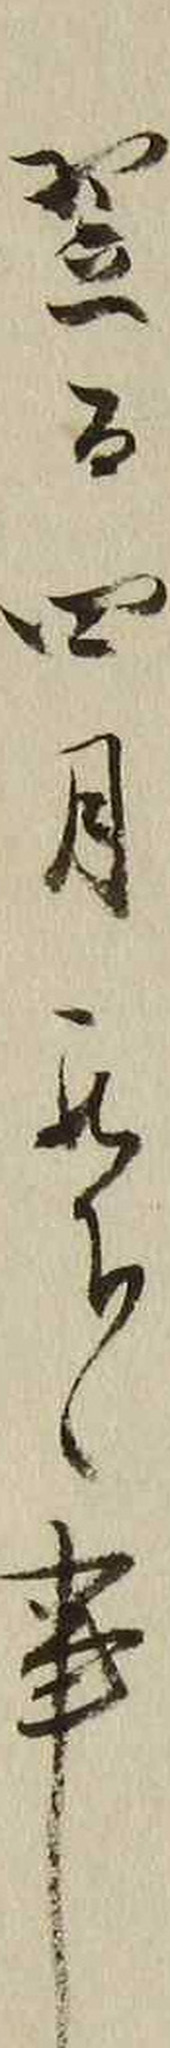翌酉四月罷下候事
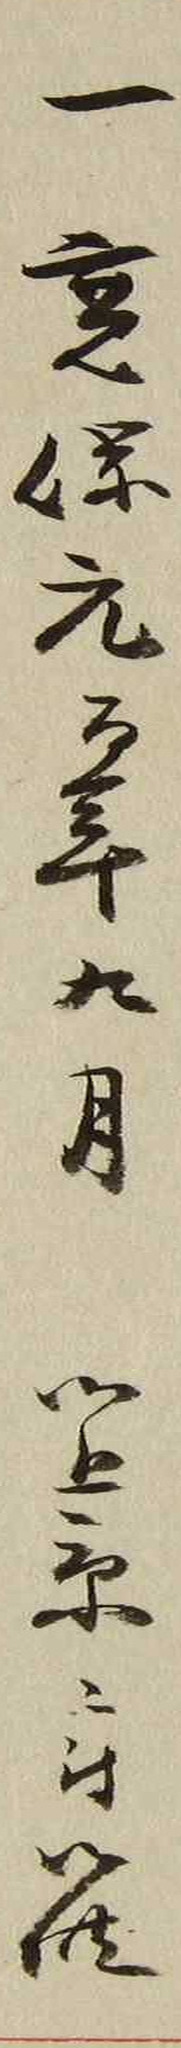一享保元酉年九月御上京ニ付御供
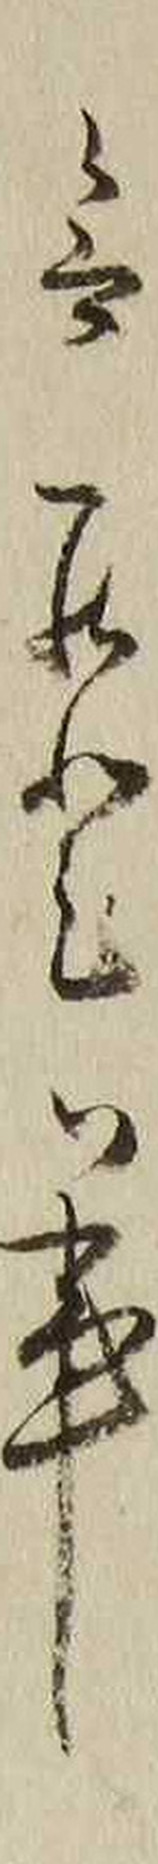ニ而罷登候事
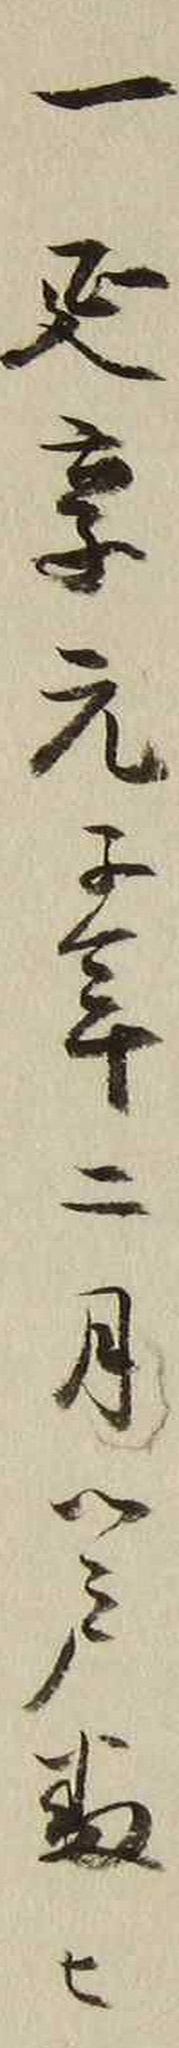一延享元子年二月御戸番被
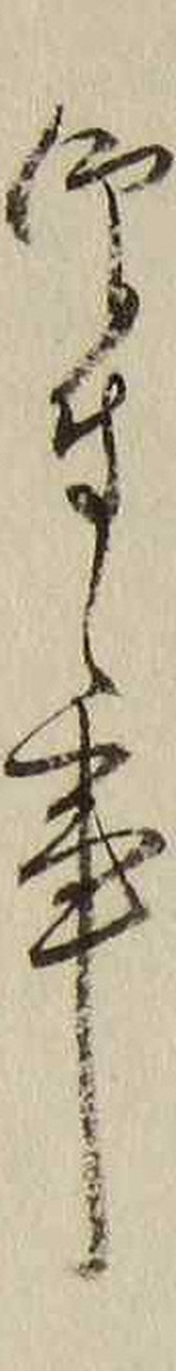仰付候事
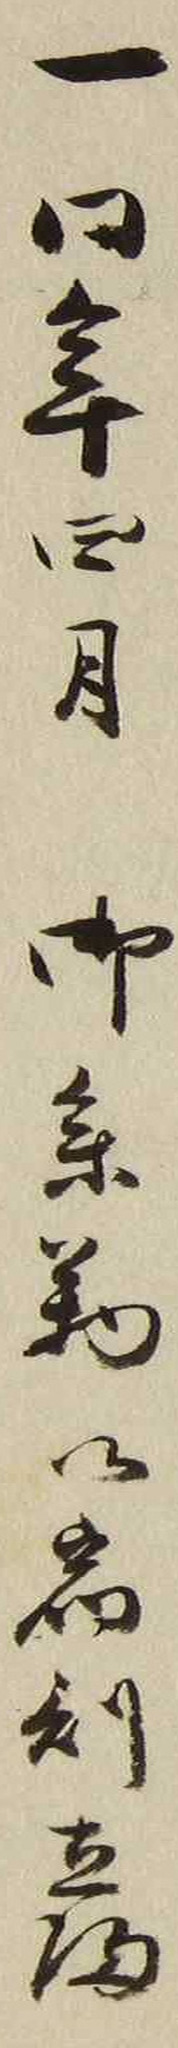一同年四月御参勤御宿割立帰
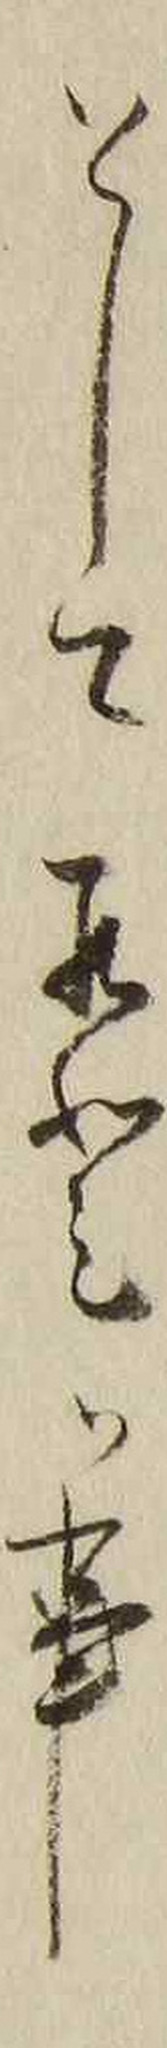として罷登候事

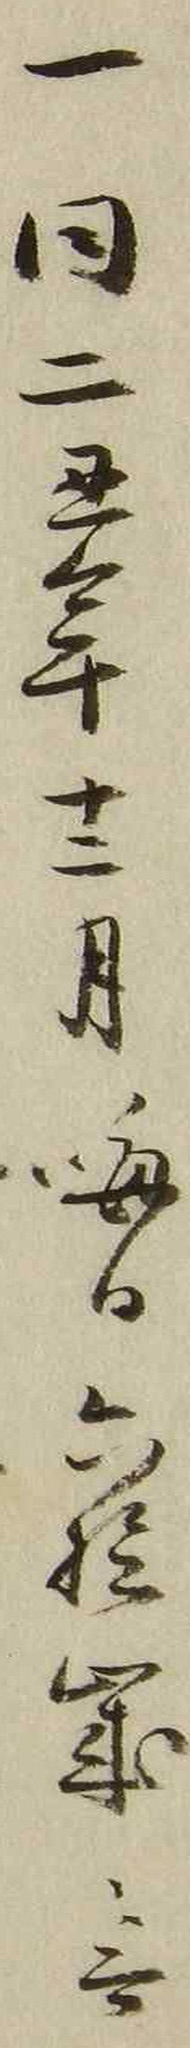一同二丑年十二月晦日六拾歳ニ而
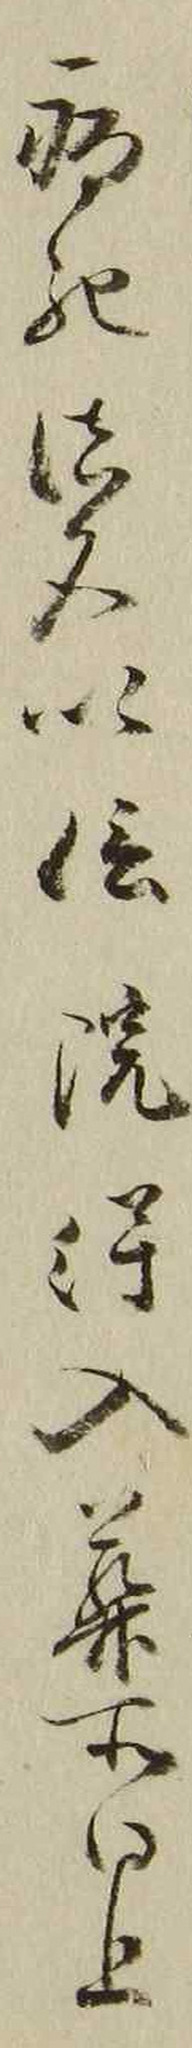病死法名以信院得入葬所同上
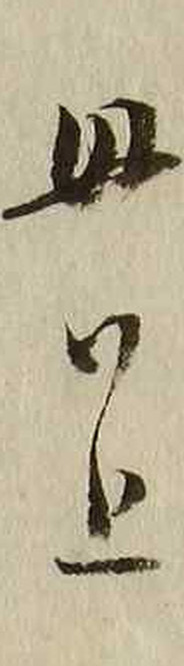母同上
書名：諸士系譜　巻之288　さ之部20
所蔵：会津若松市立会津図書館
